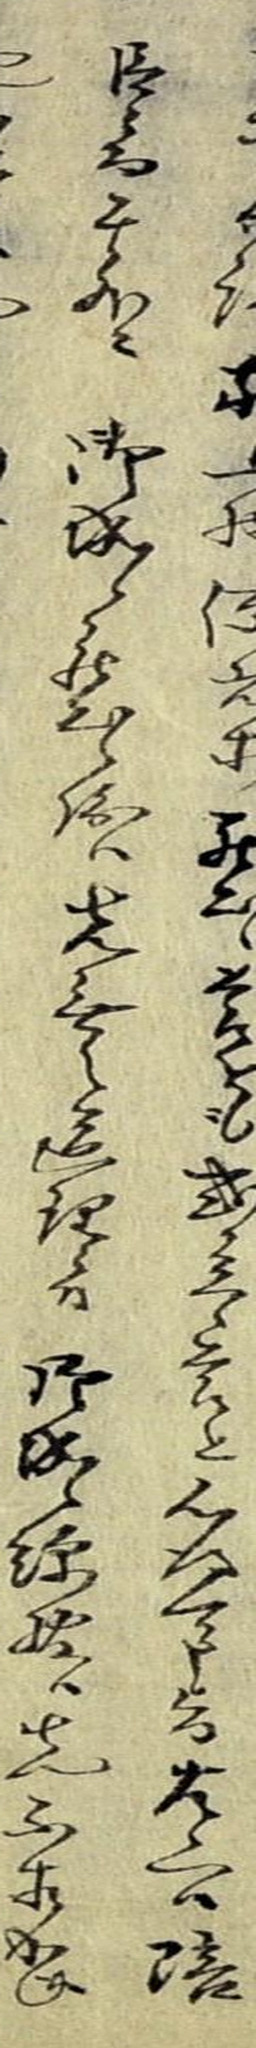臣に而其外に御城へ罷出候儀は先無之道理に付御城へ綿服は先不相成趣
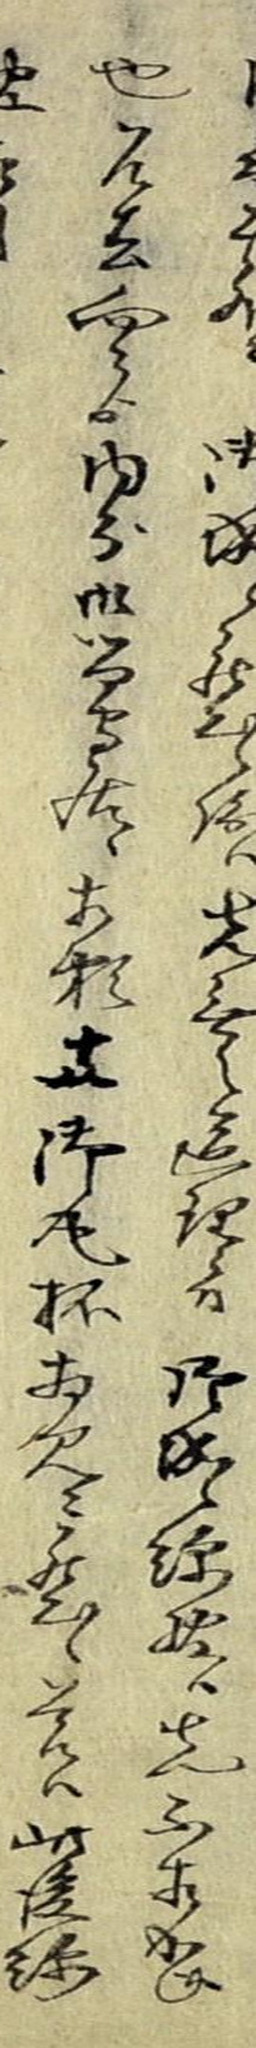也乍去向にゟ内分御留守居へ相頼両御丸抔拝見に罷出候節は此後綿
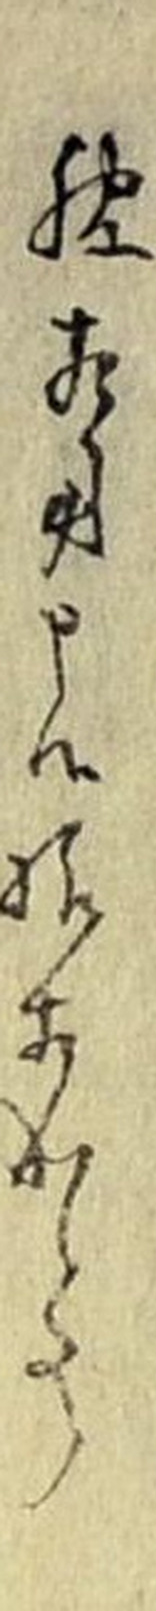服相用申候様相成候事
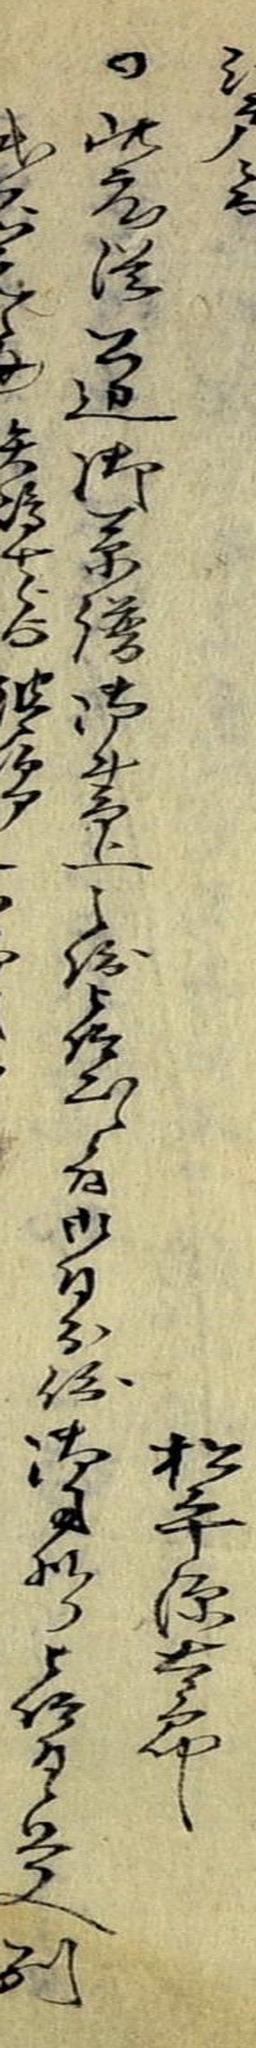○此度従公辺御系譜御書上之儀被仰出候に付御自分儀御用掛り被仰付候且又別
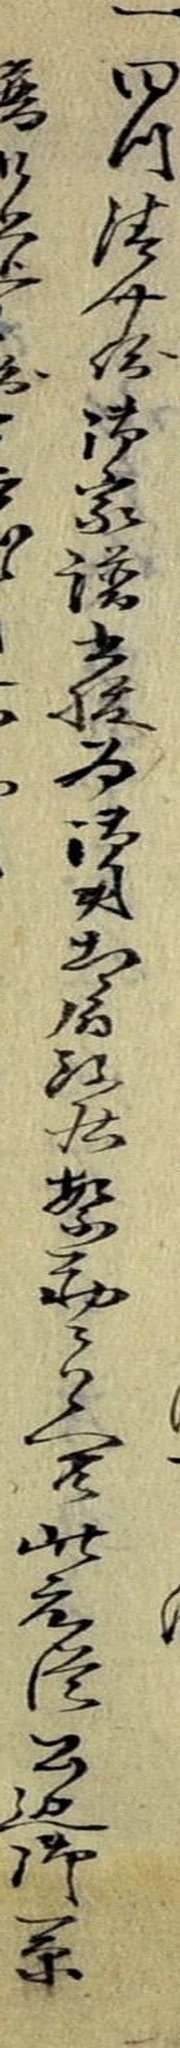一田川清介儀御家譜書抜為御用出府致居繁勤に候へ共此度従公辺御一系
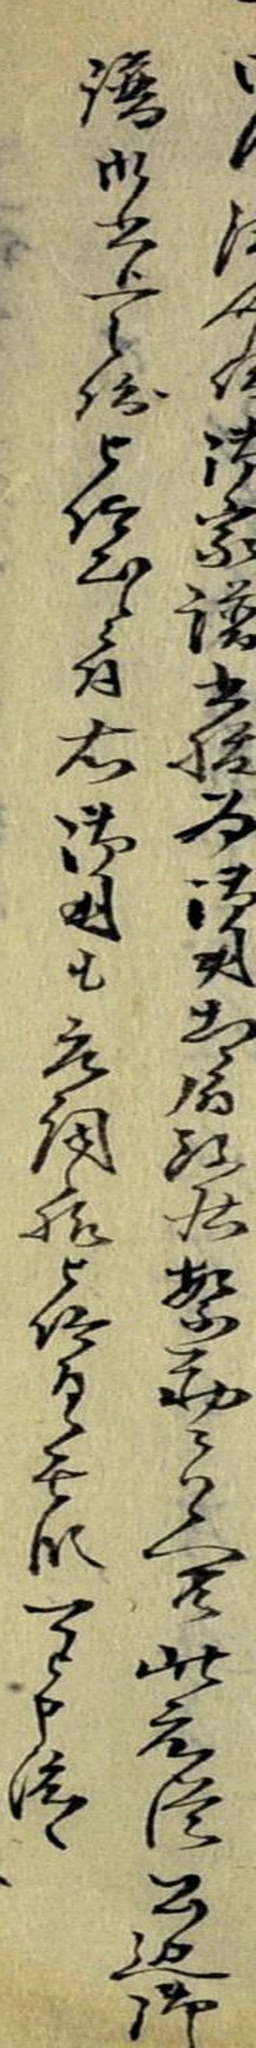譜御書上之儀被仰出候に付右御用も取調候様被仰付候其段可被申渡候
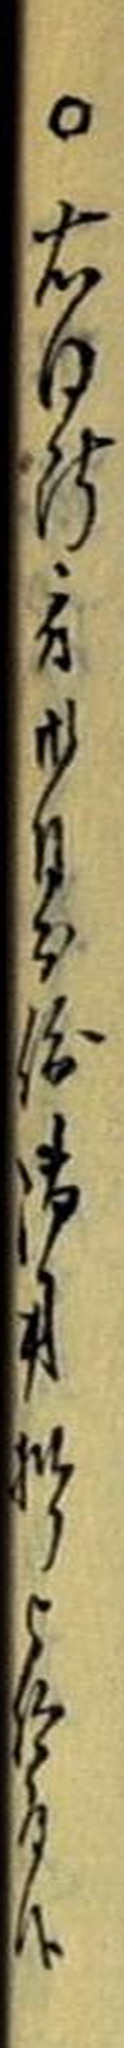○右同断に付御自分儀御用掛り被仰付候
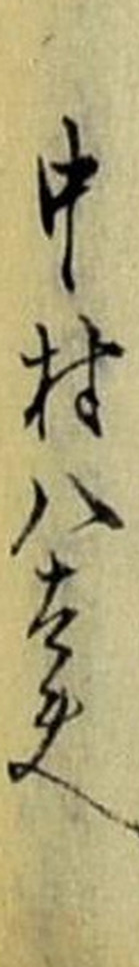中村八太夫
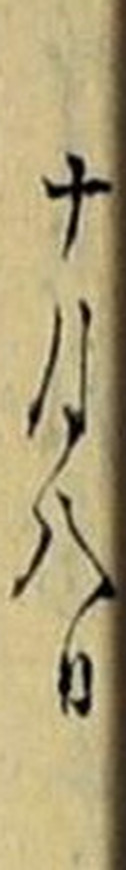十月八日
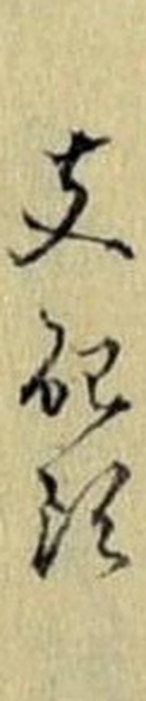支配頭
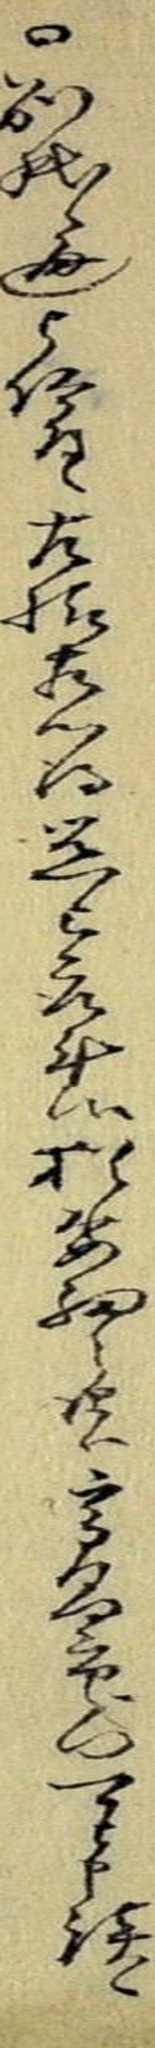○別紙之通被仰付候左様相心得宜被取斗候猶委細之儀は高畠市郎右衛門可被申談候
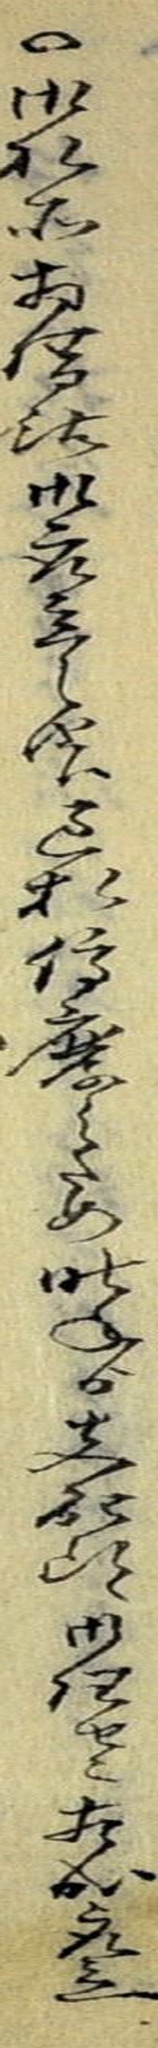○御札所拝借銀御取立之儀は過札停廃之ため昨年ゟ支配頭へ御任せに相成取立
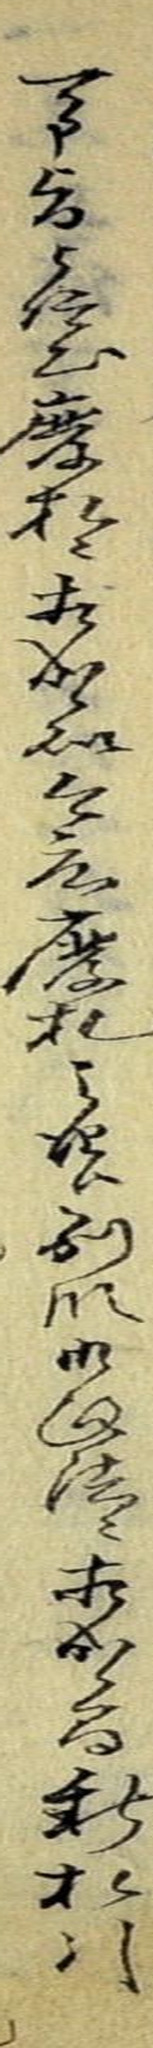可申旨被仰出廃札に相成候処今度廃札之儀は別段御趣法に相成候間新札引
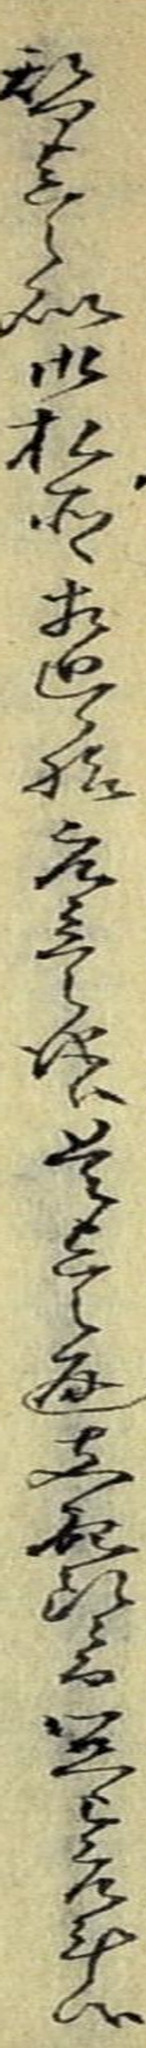替迄之処御札所へ相廻り候様取立之儀は是迄之通支配頭に而宜被取斗候
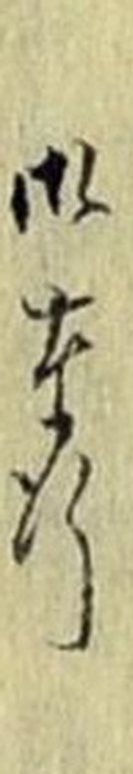御奉行
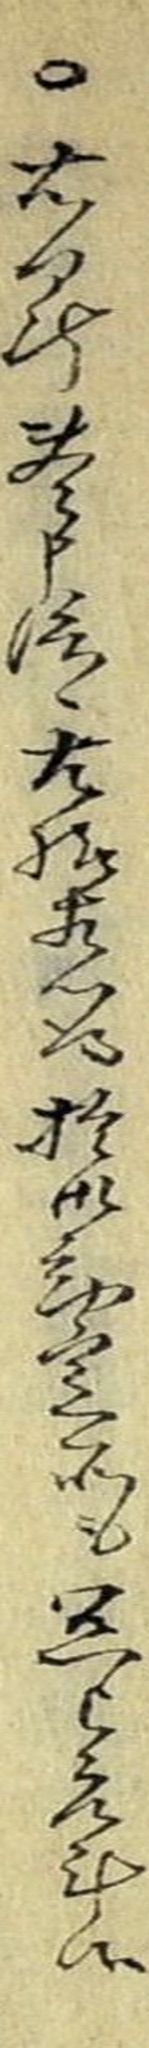○右同断夫々申渡候左様相心得於御勘定所も宜被取斗候
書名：命令之部 六
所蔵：福井県文書館 Fukui Prefectural Archives
